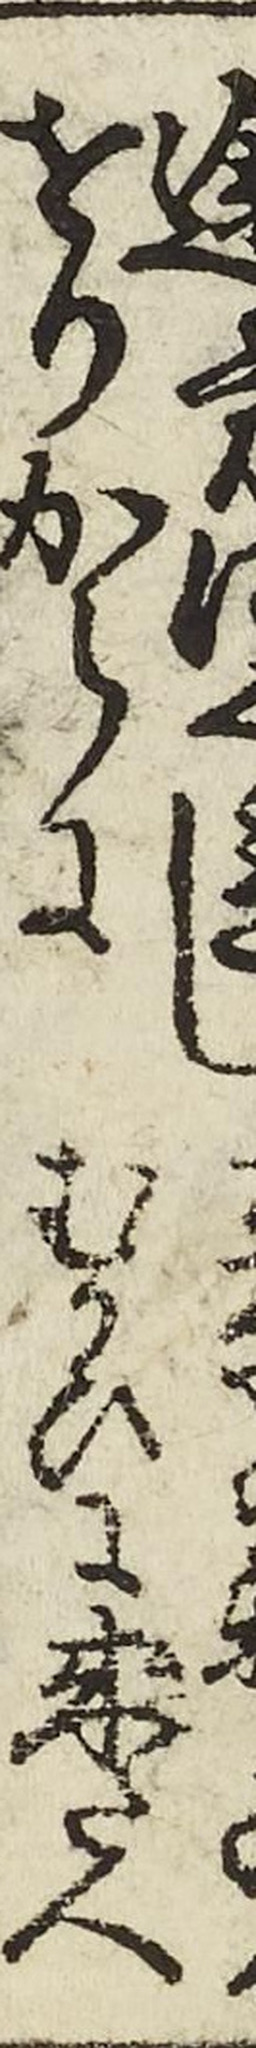をりからにむかひに来た人
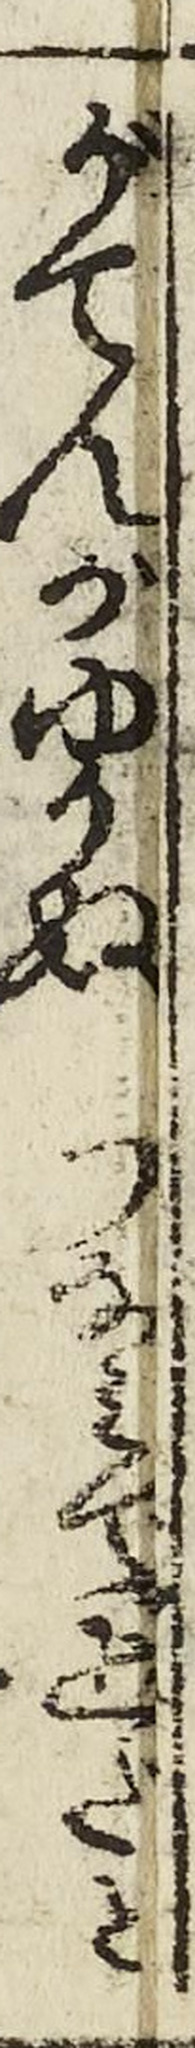がてんがゆかぬつなみで止だと
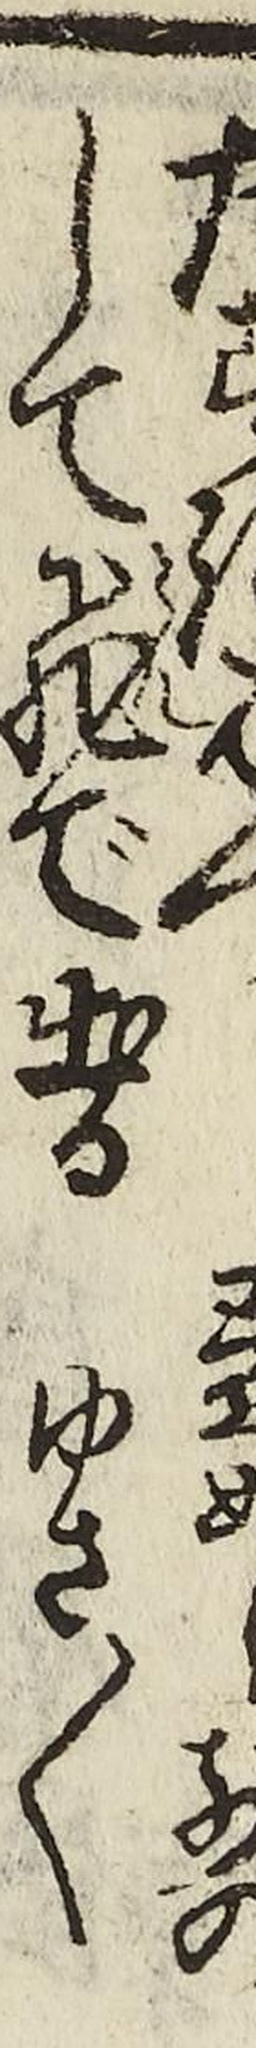して飛で出るゆさ〳〵
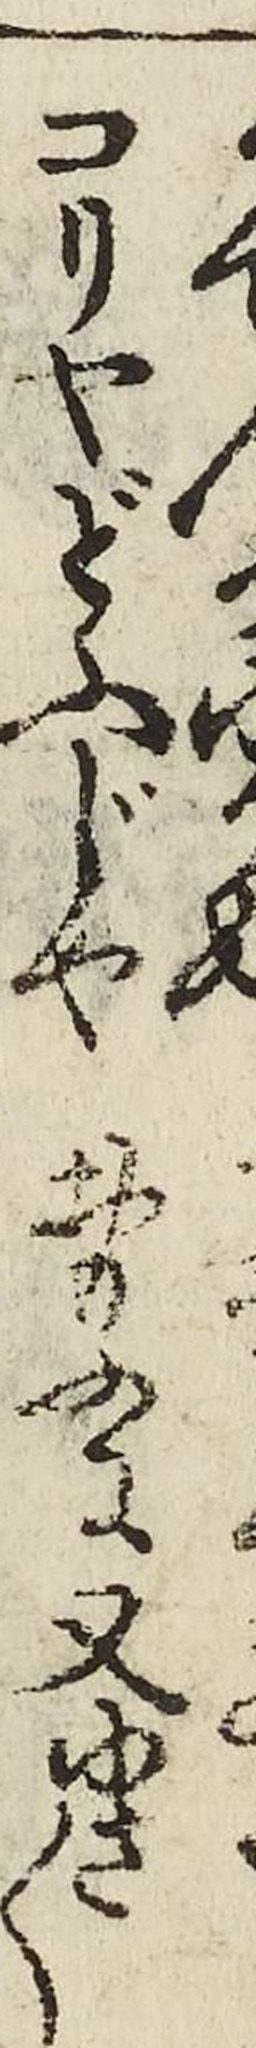コリヤどふじやおもふに又ゆさ〳〵
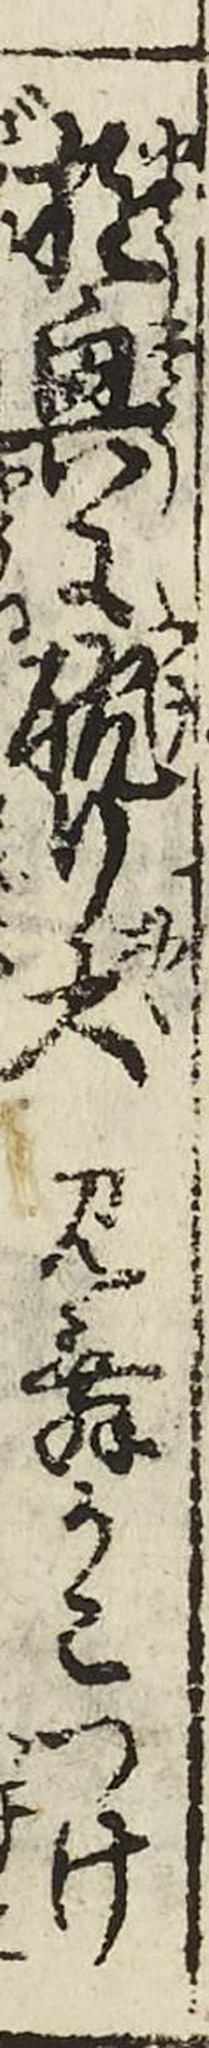遊興に耽り大見舞かこつけ
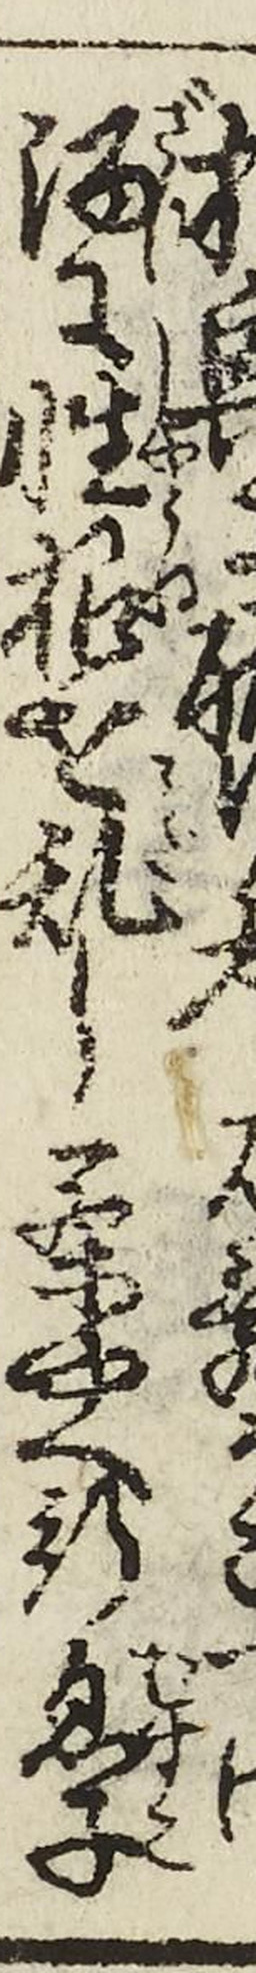酒に性根を乱し茶やへ行息子
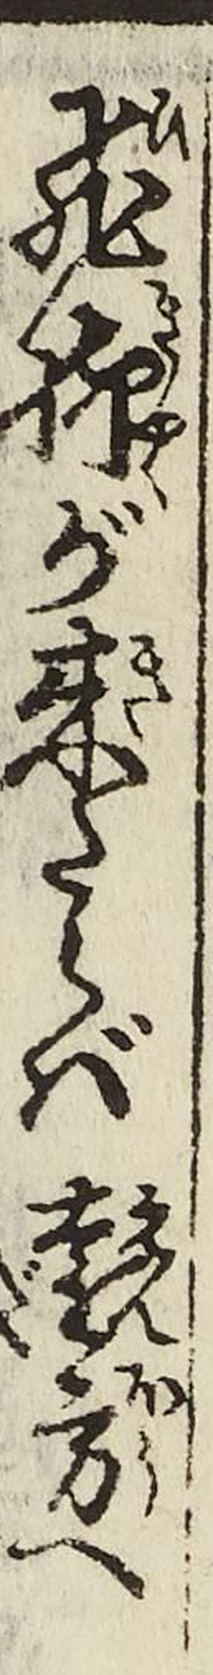飛脚が来たらば遠方へ
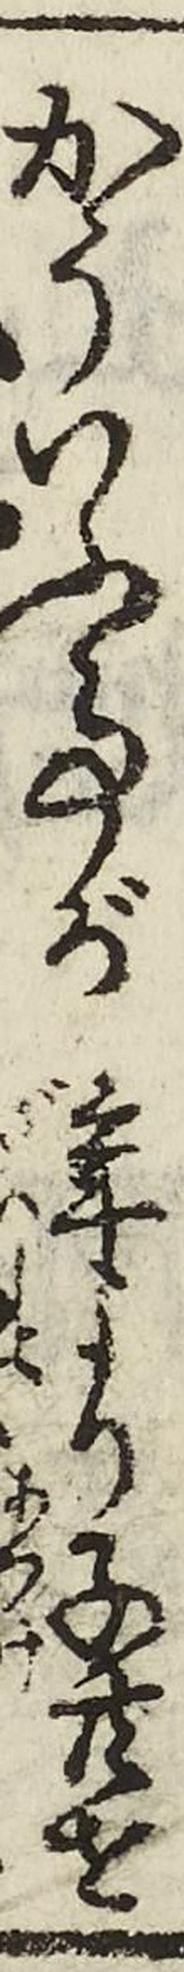かういふ事が年より子共を
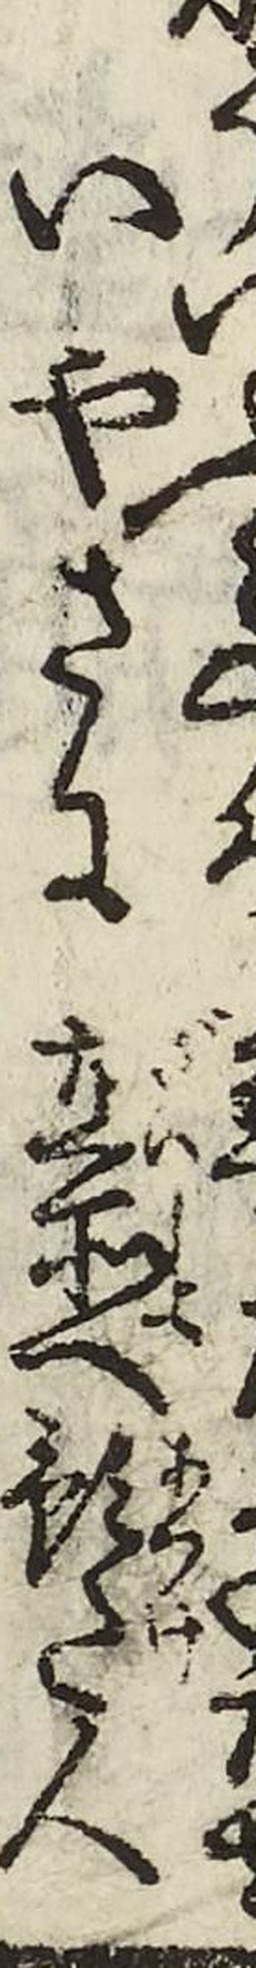いやさに在所へ預た人
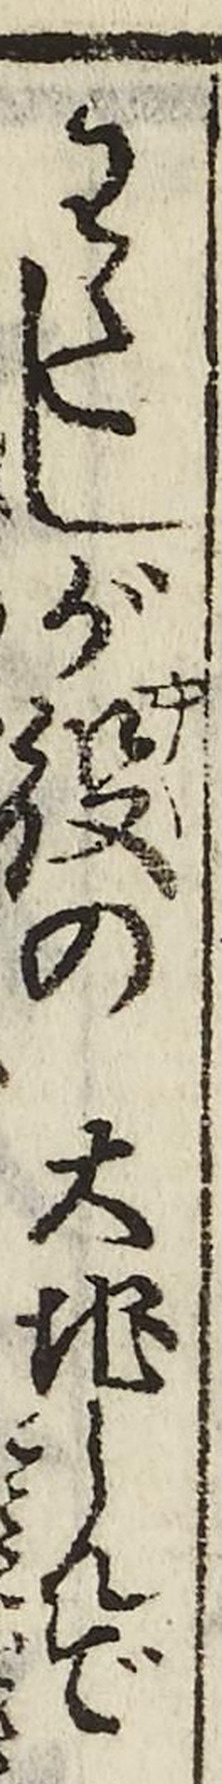わたしが役の大地しんで
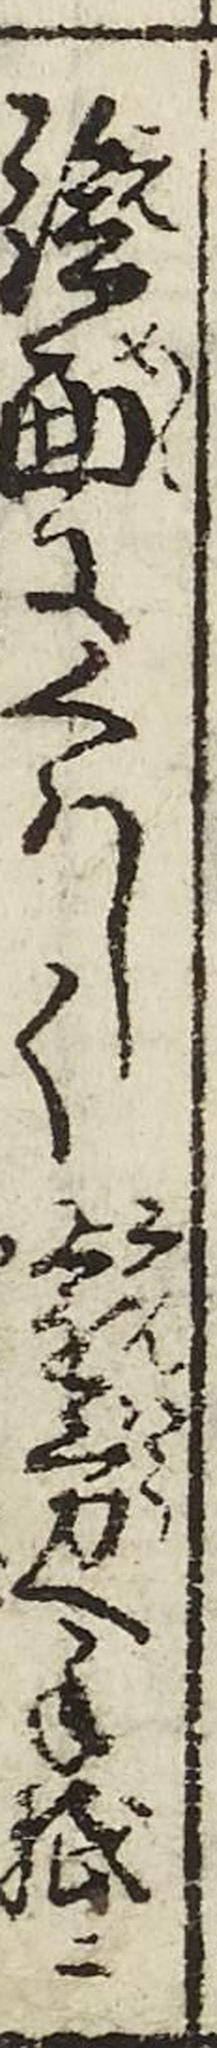絵面にくはしく遠方へ手紙ニ
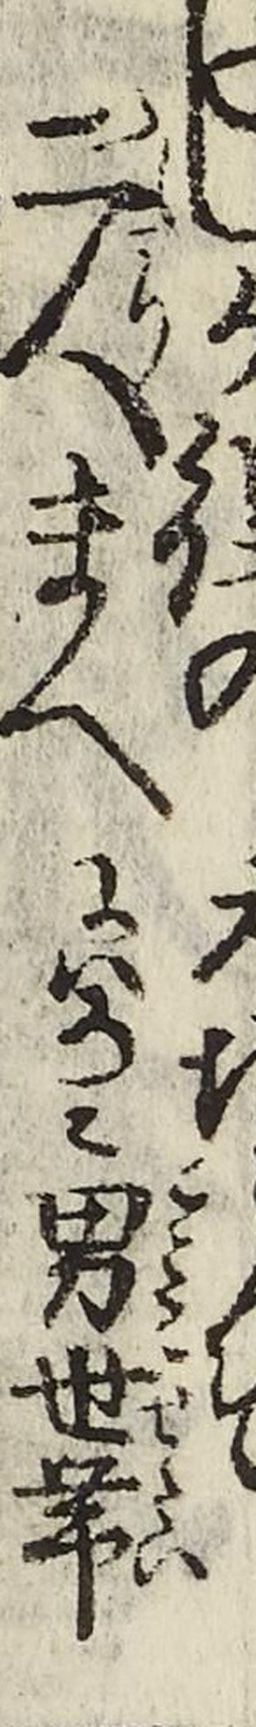二人まへにはかニ男世帯
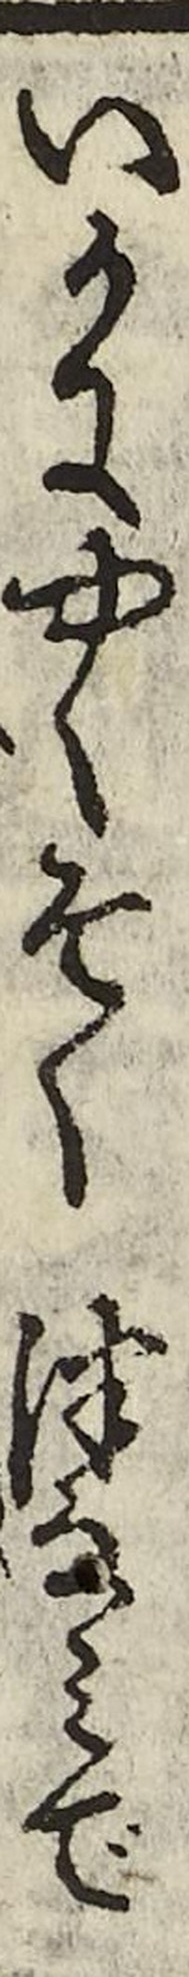いかにやくそく津なみで
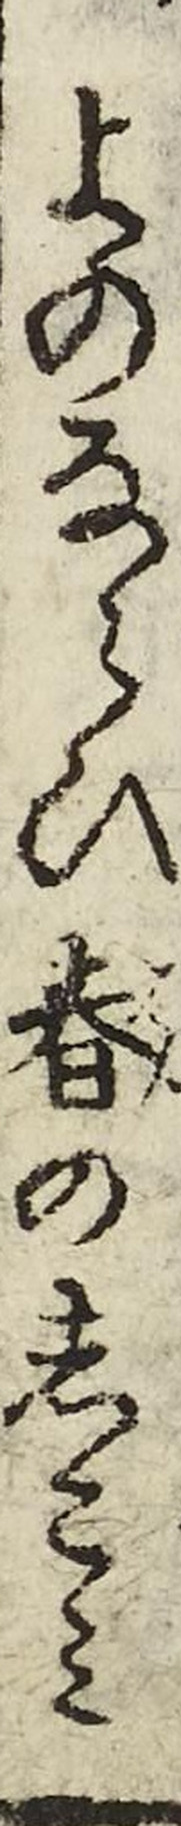よのならひ春のしこみ

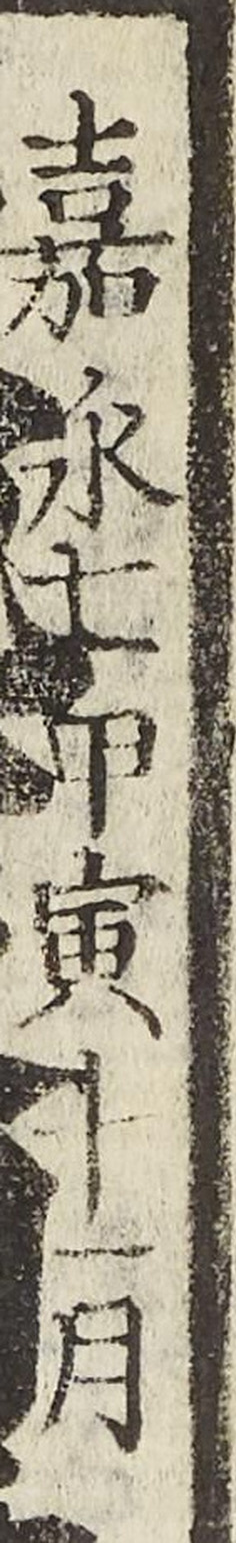嘉永七甲寅十一月
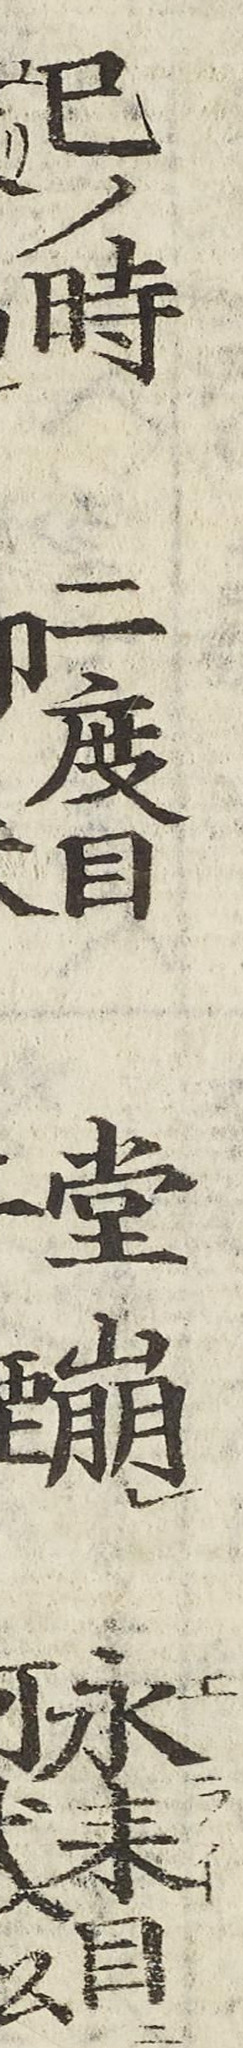巳ノ時二度目堂崩レ永来目ニ
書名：地震津浪末代噺の種　全
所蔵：東京大学地震研究所図書室 Earthquake Research Institute Library, The University of Tokyo, JAPAN
